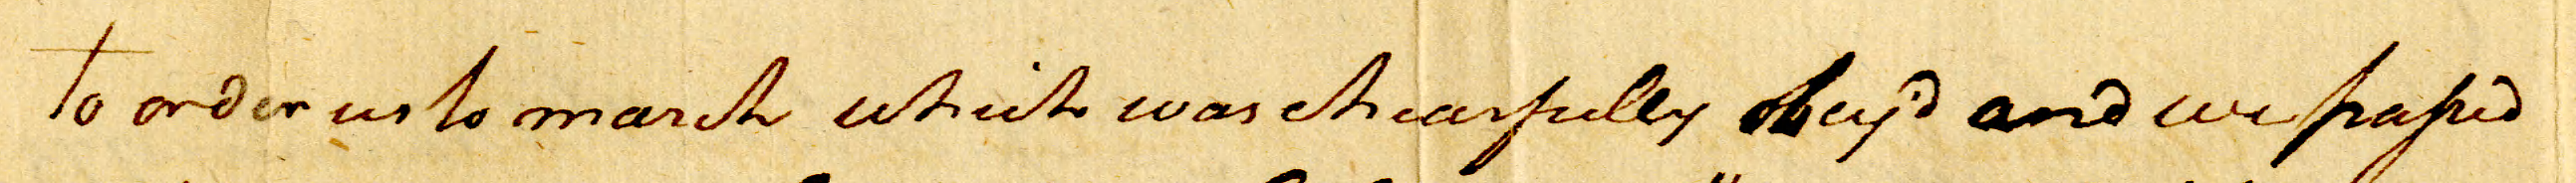to order us to march which was chearfully obey'd and we passed
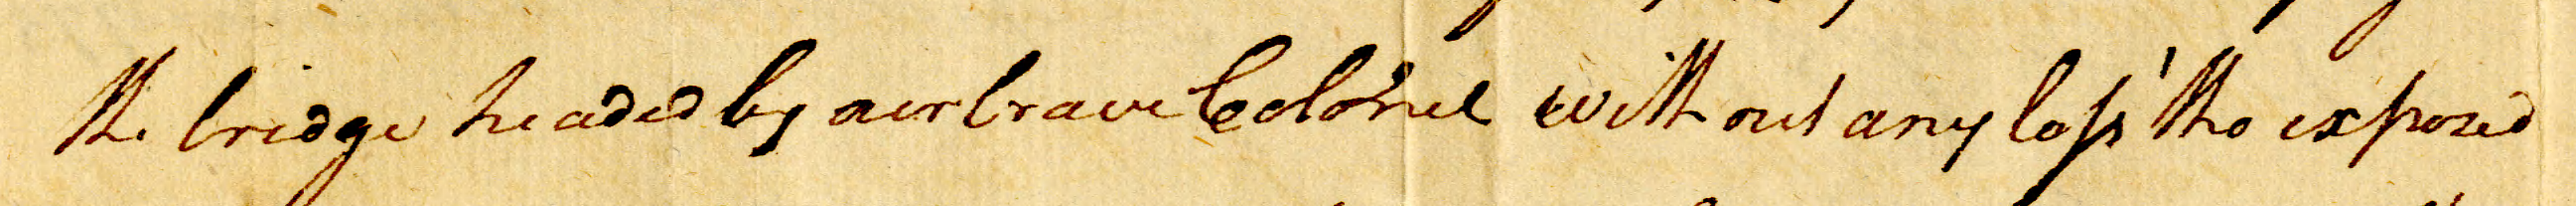the bridge headed by our brave Colonel without any loss 'tho exposed
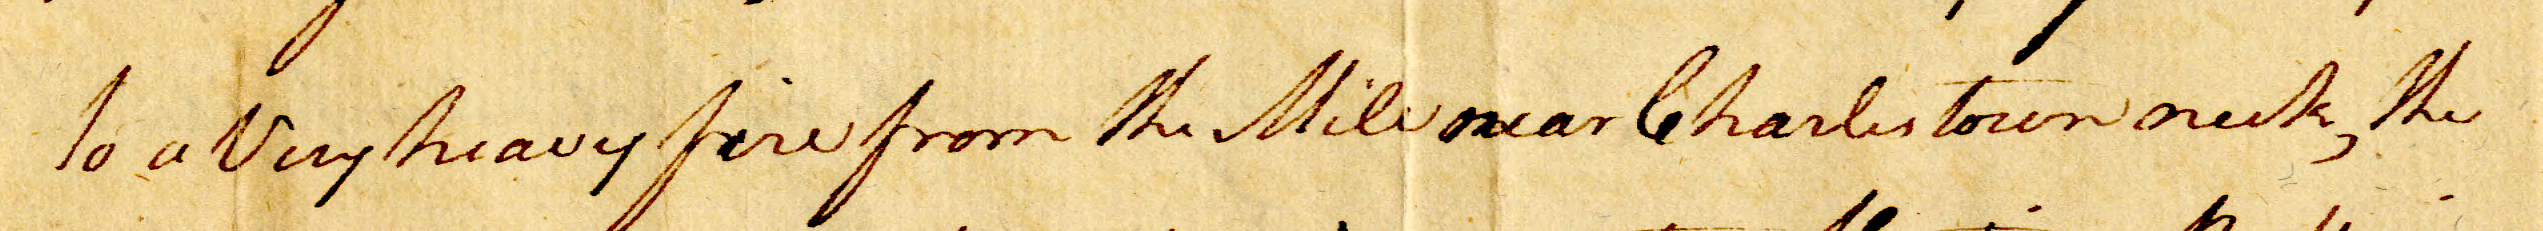to a very heavy fire from the Mill near Charlestown neck, the
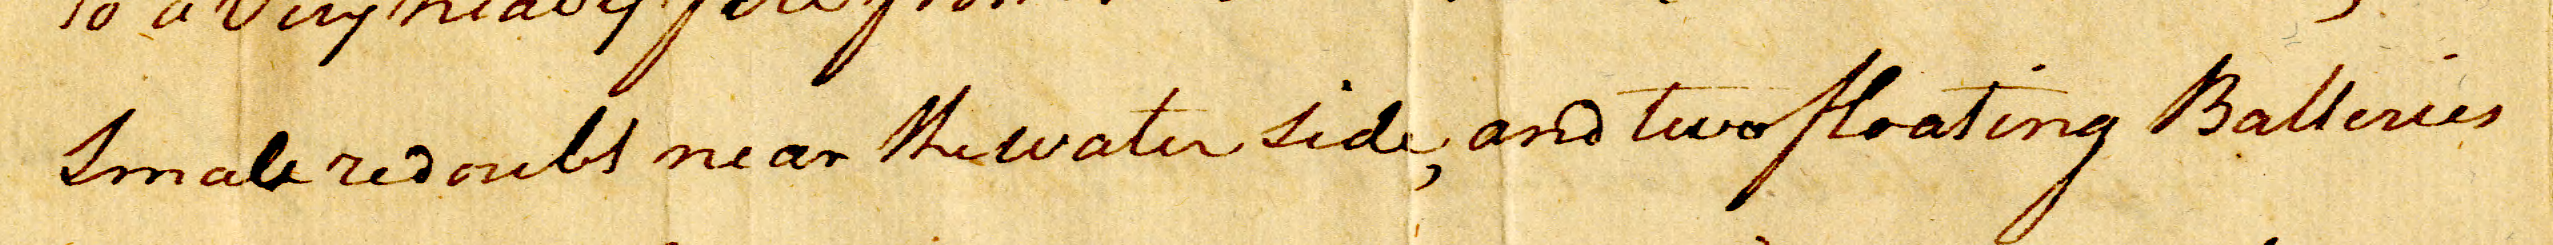small redoubt near the water side, and two floating Batteries
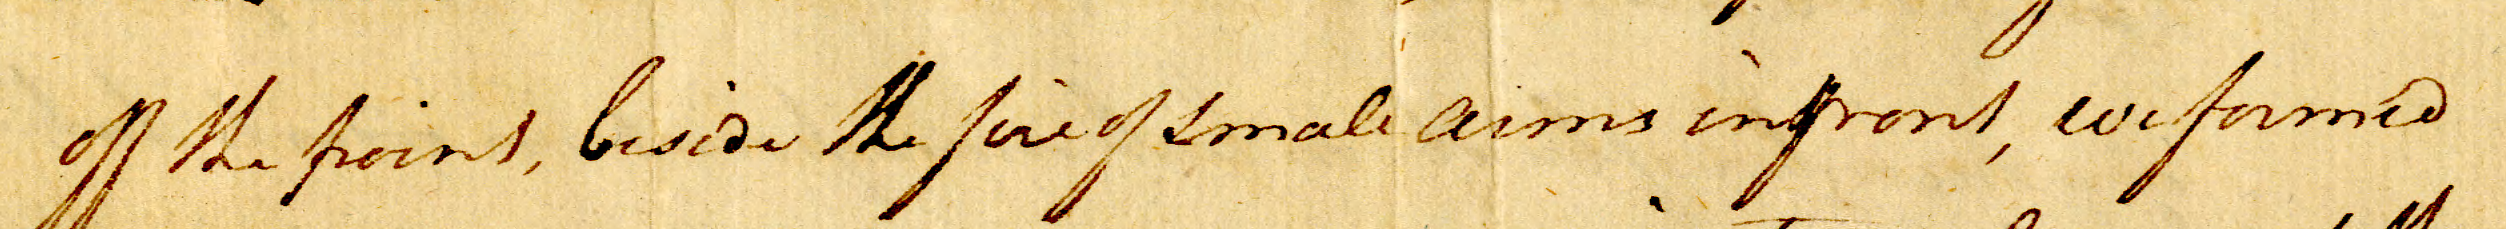off the point, besides the fire of small arms in front, we formed
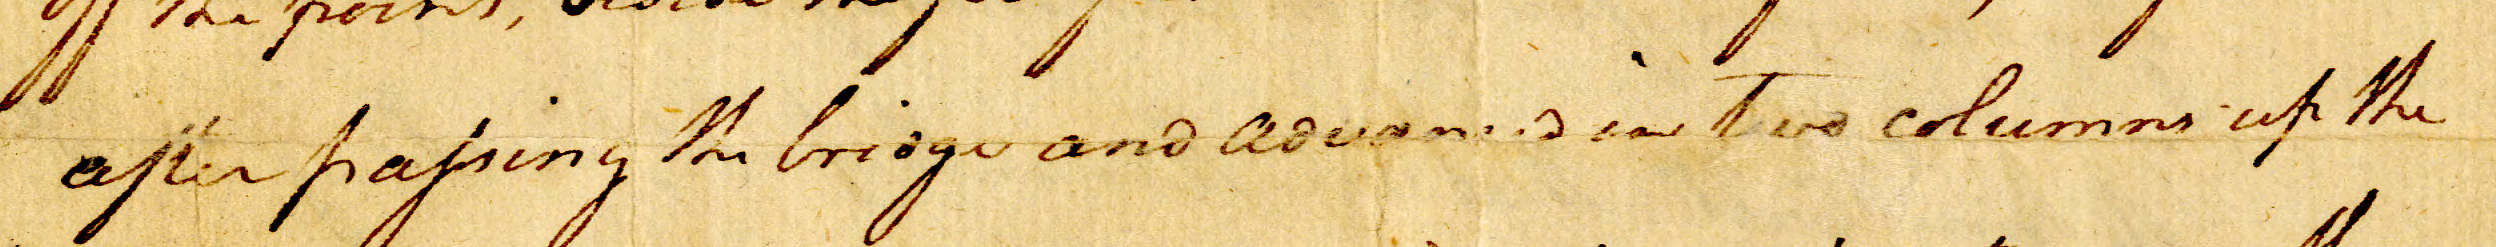after passing the bridge and advanced in two columns up the
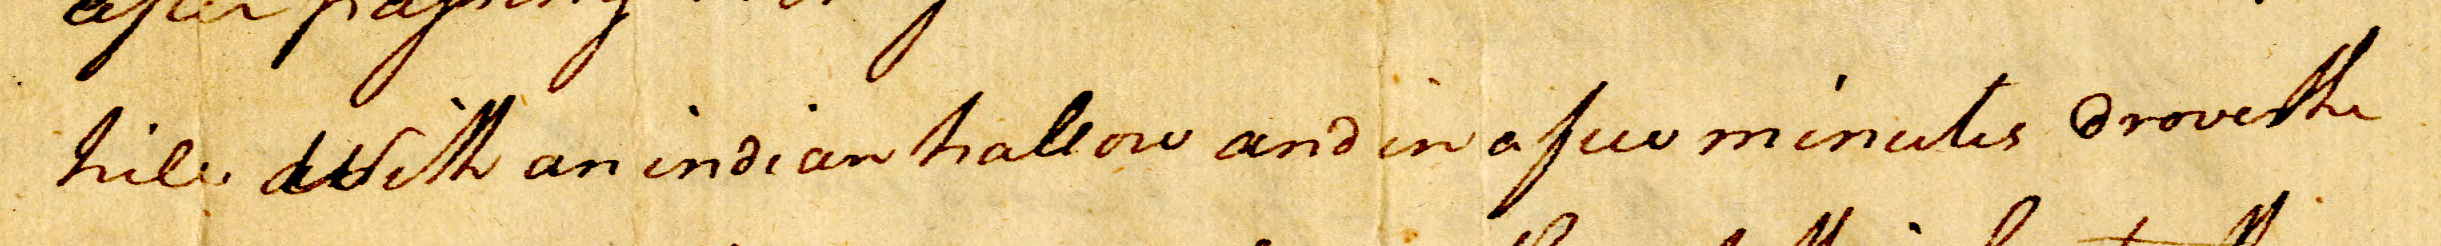hill with an indian hallow and in a few minutes drove the
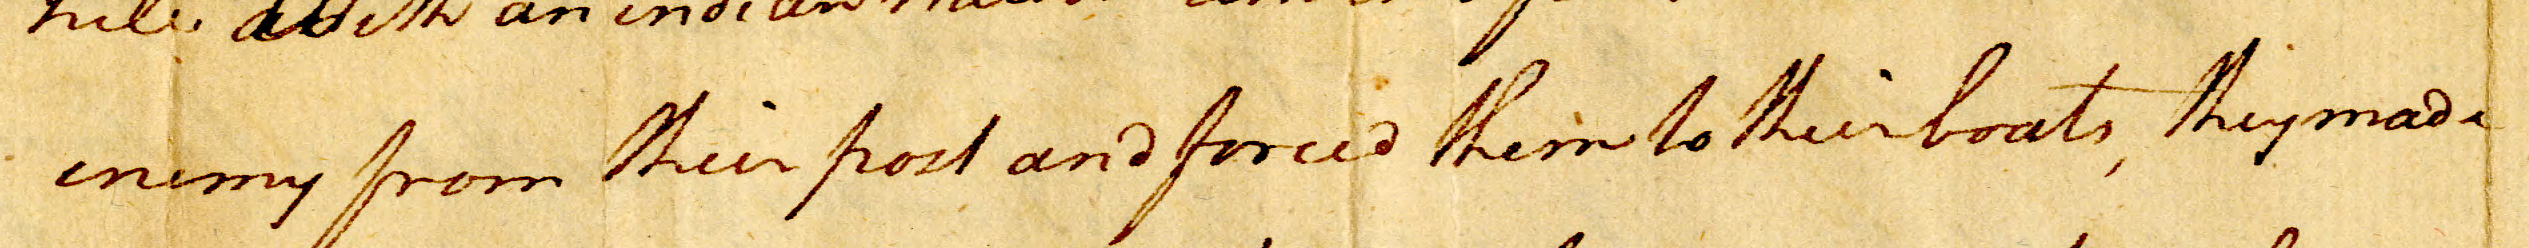enemy from their post and forced them to their boats, they made
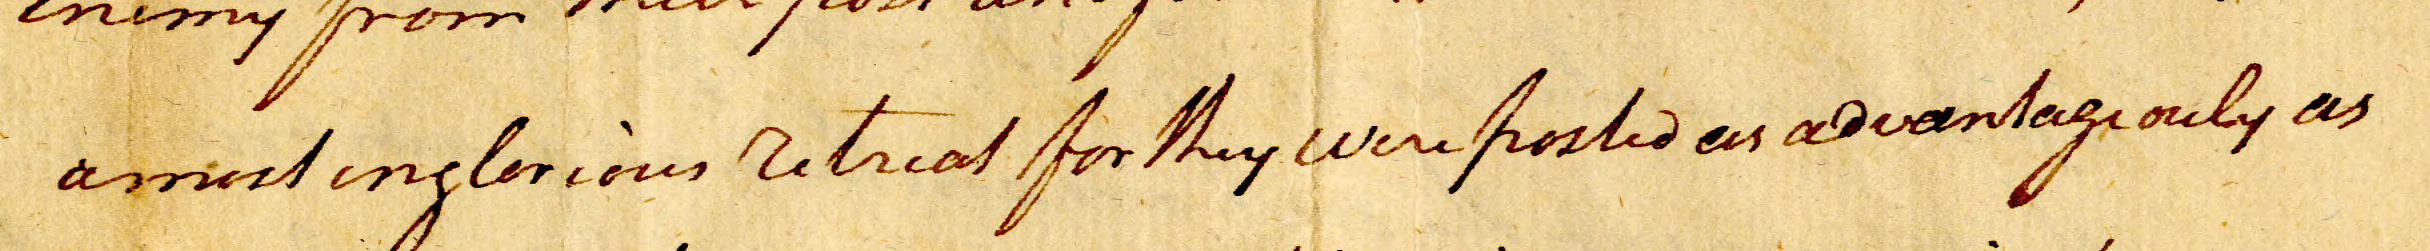a most inglorious retreat for they were posted as advantageously as
